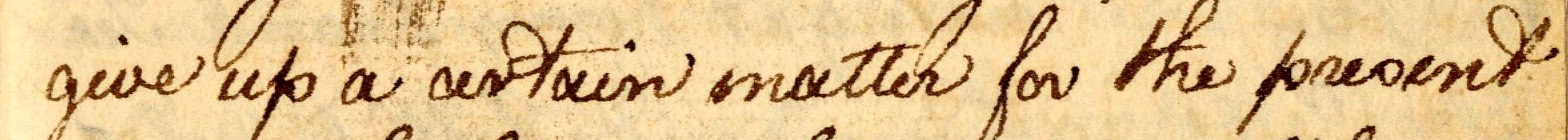give up a certain matter for the present
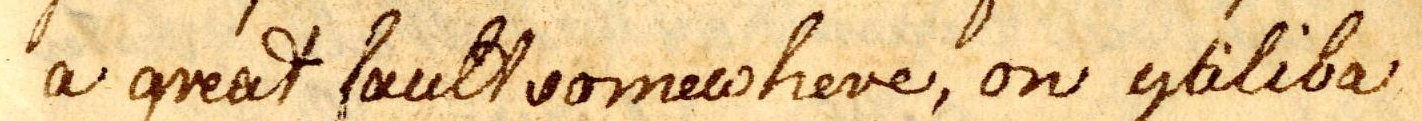a great fault somewhere, on ytiliba
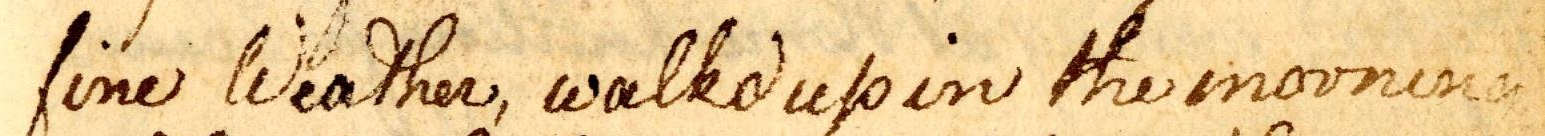fine Weather, walkd up in the morning
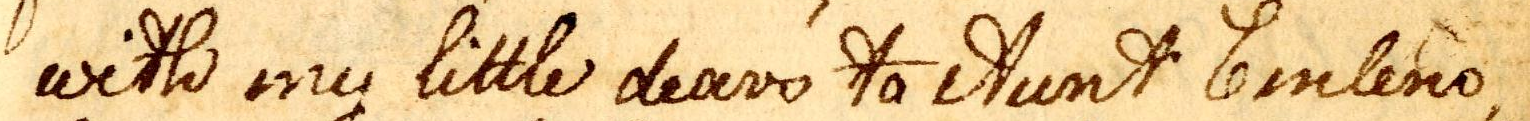with my little dears to Aunt Emlens
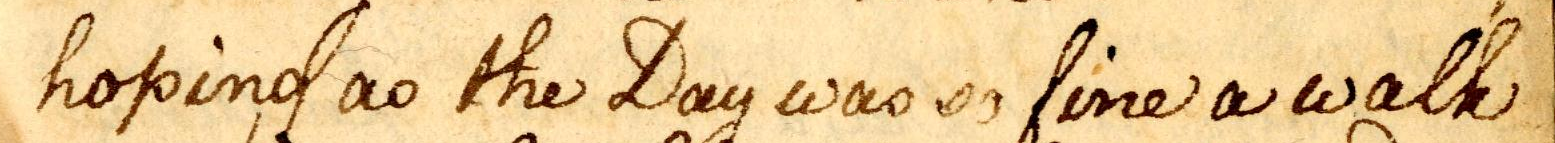hoping as the Day was as fine a walk
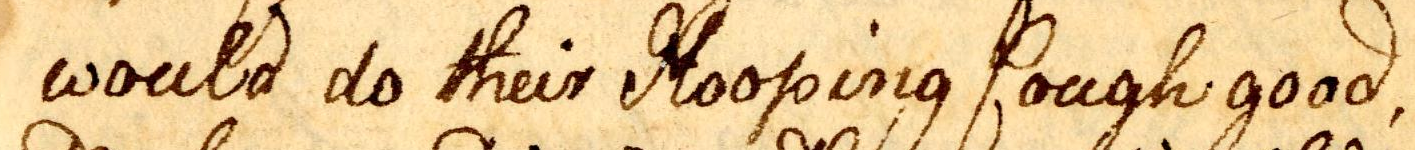would do their Hooping Cough good,
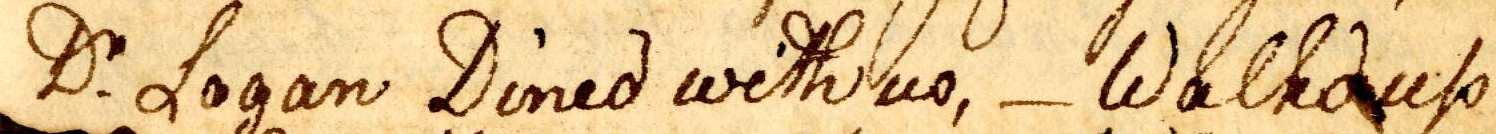D^r. Logan Dined with us,- Walkd up
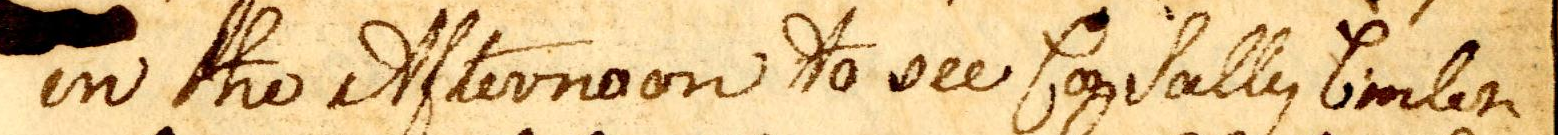in the Afternoon to see Coz Sally Emlen
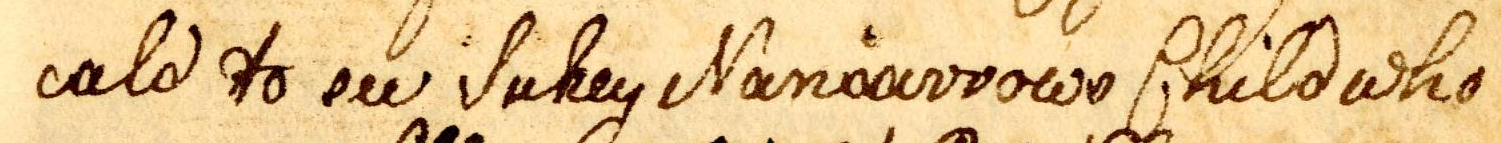cald to see Sukey Nancarrows Child who
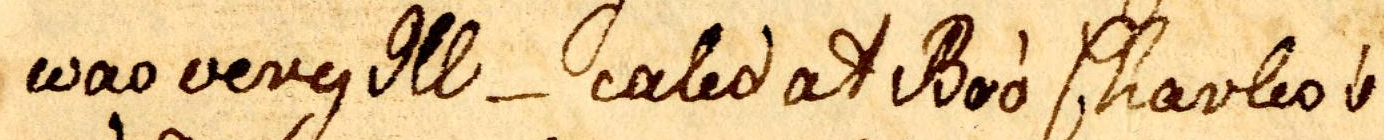was very Ill- caled at Bro' Charles's
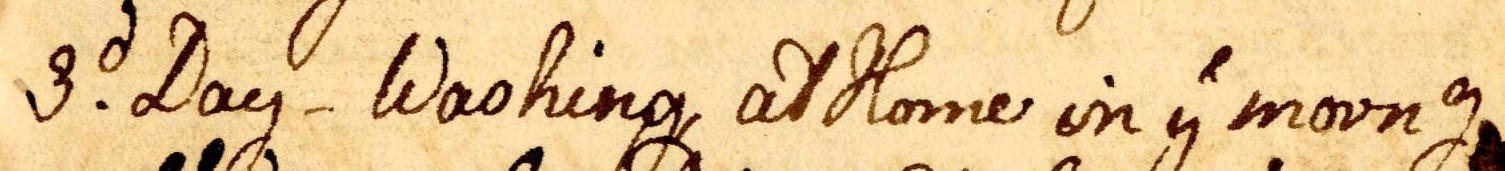3^d Day- Washing at Home in y^e morn^g
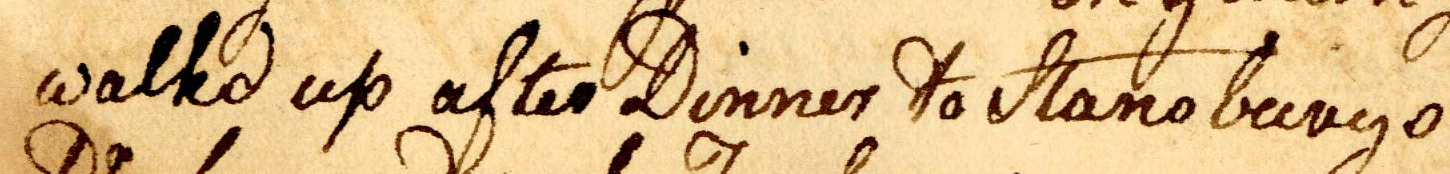walkd up after Dinner to Stansburys
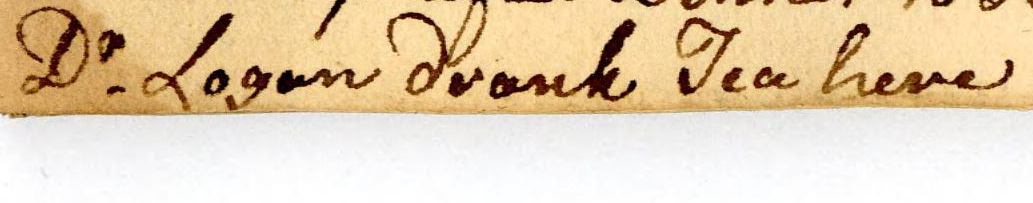D^r. Logan drank Tea here
